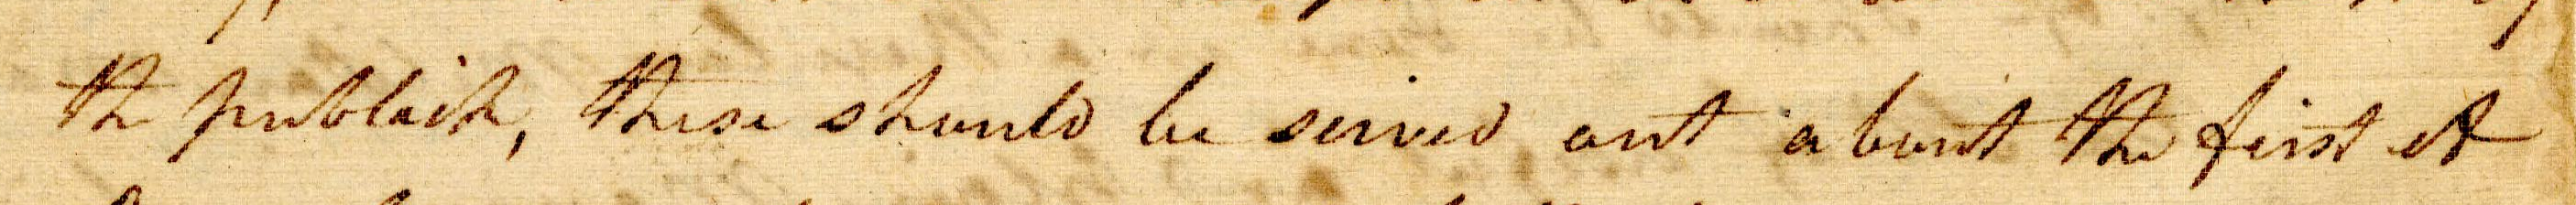the publick, these should be served out about the first of
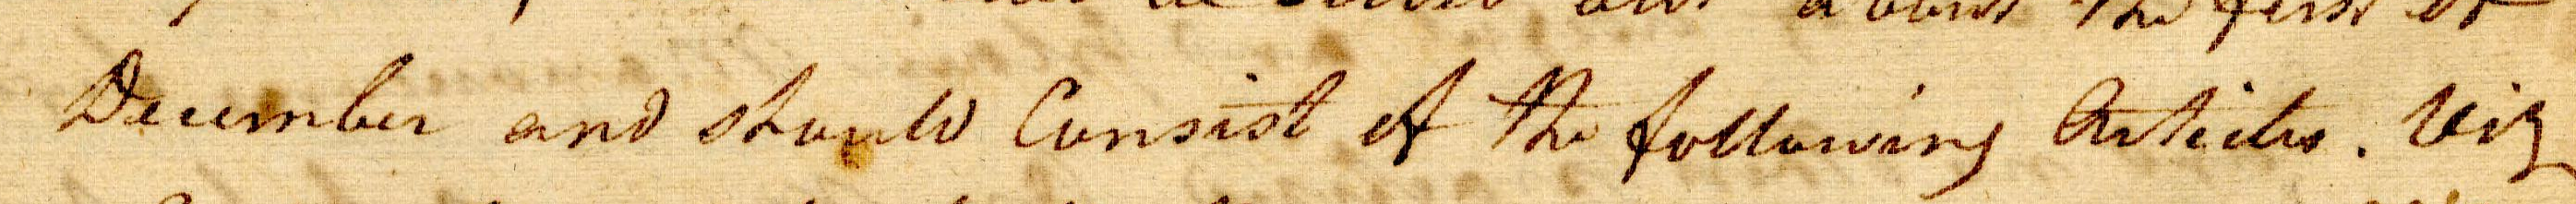December and should consist of the following Articles. Viz
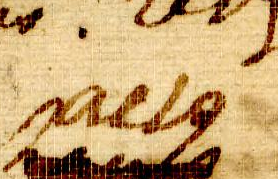alls
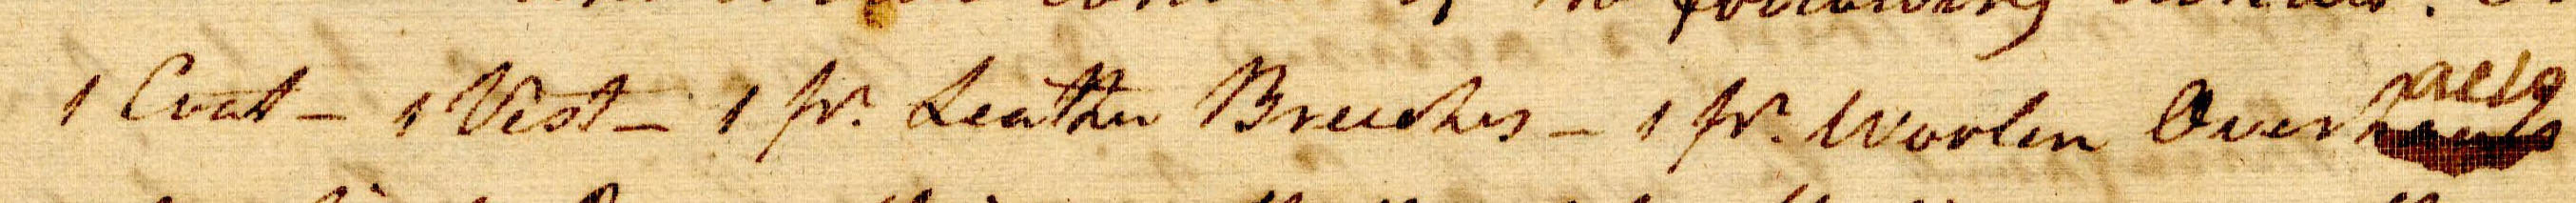1 Coat- 1 Vest- 1 pr. Leather Breeches- 1 pr. woolen over [____]
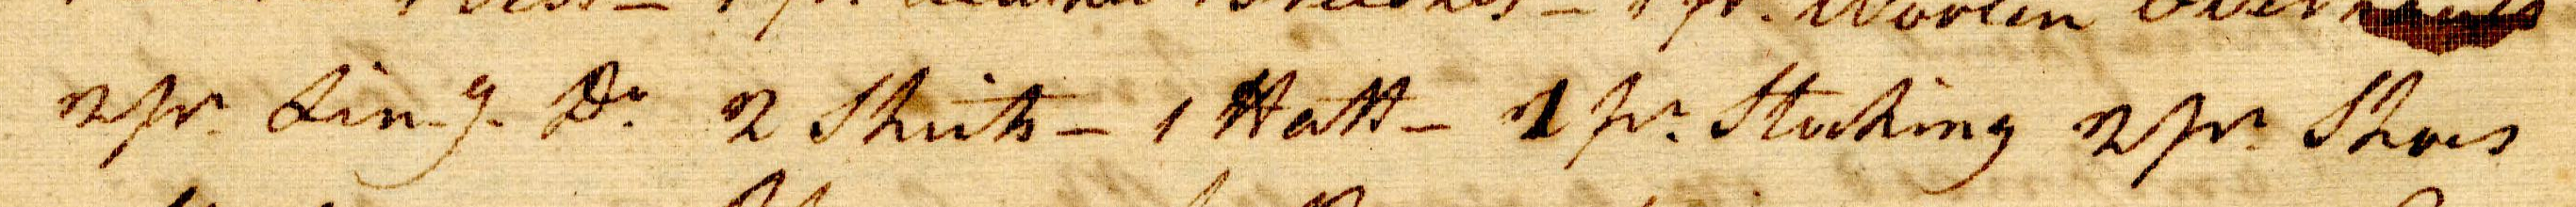2 pr. Lin^g. D^o. 2 Shirts- 1 Hatt- 1 pr. Stocking 2 pr. Shoes
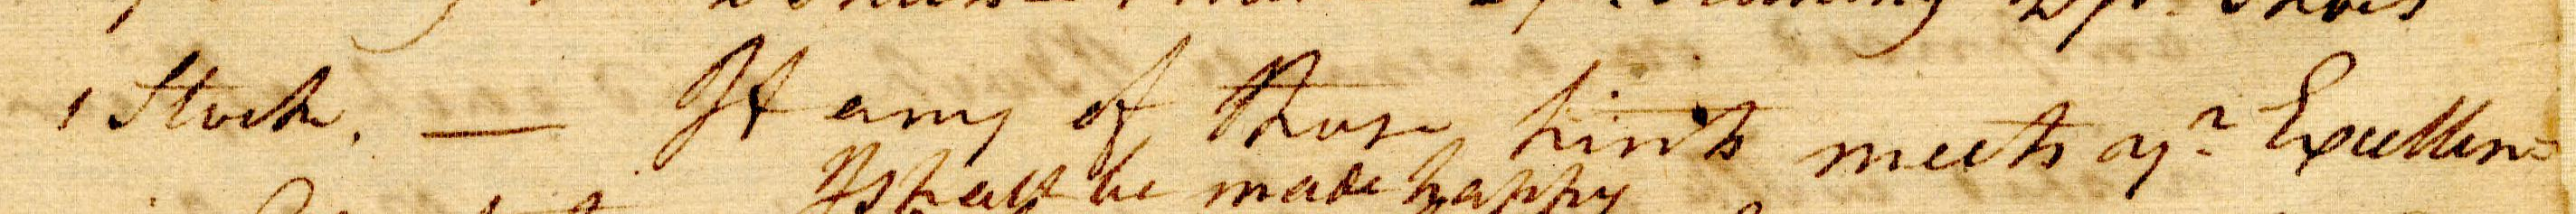1 Stock.- If any of those hints meets y^r. Excellen-
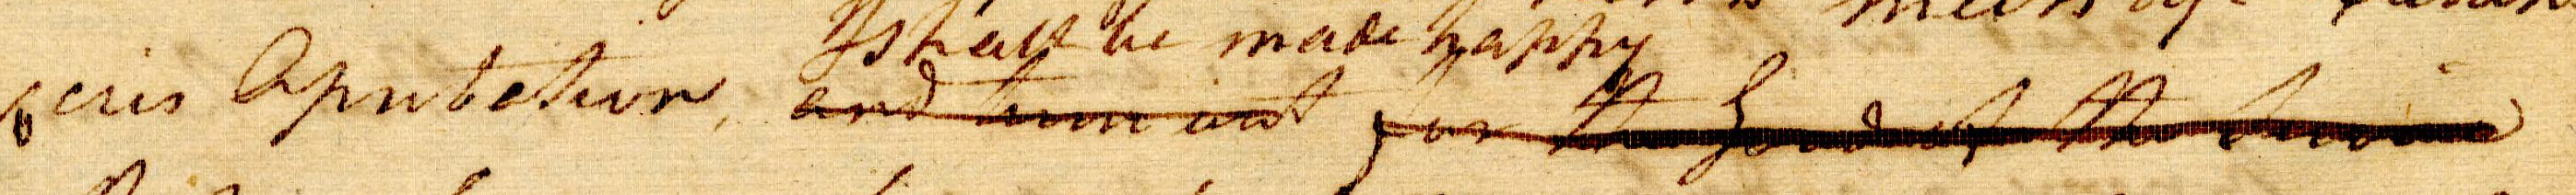cies Aprobation,[and have not] [_____________________]
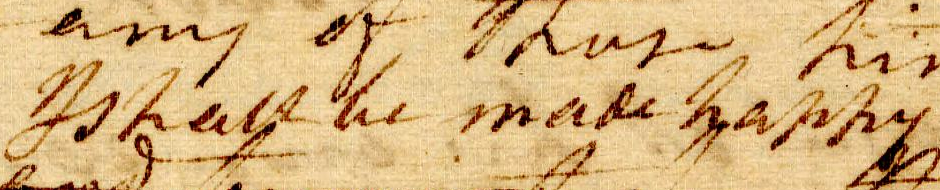I shall be made happy
